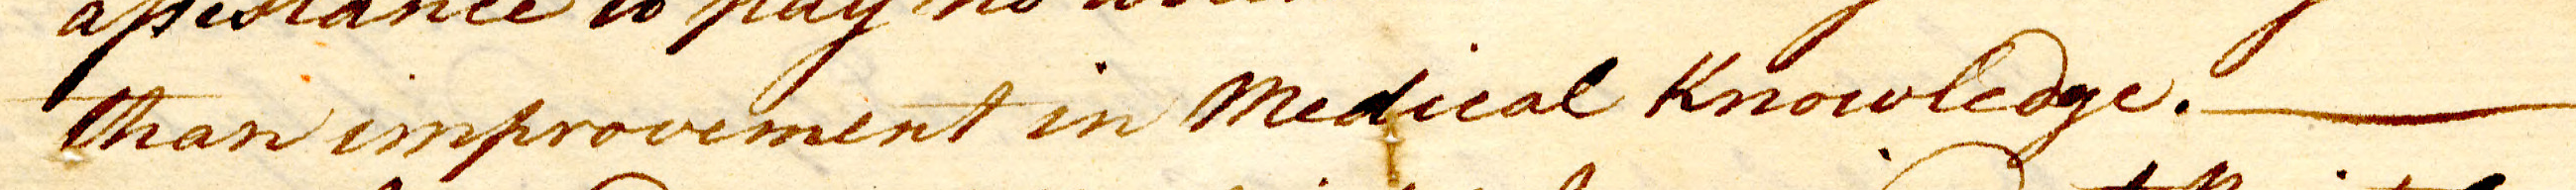than improvement in Medical Knowledge.-
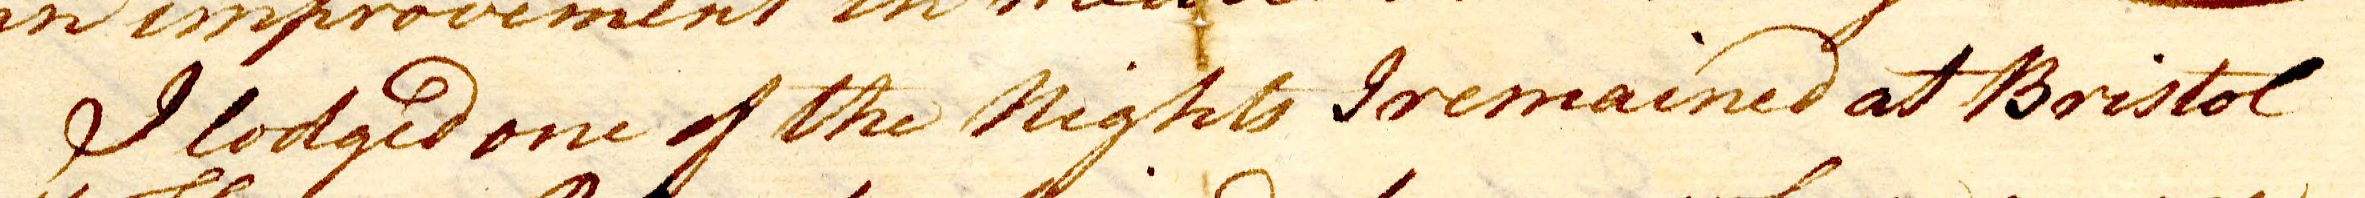I lodged one of the nights I remained at Bristol
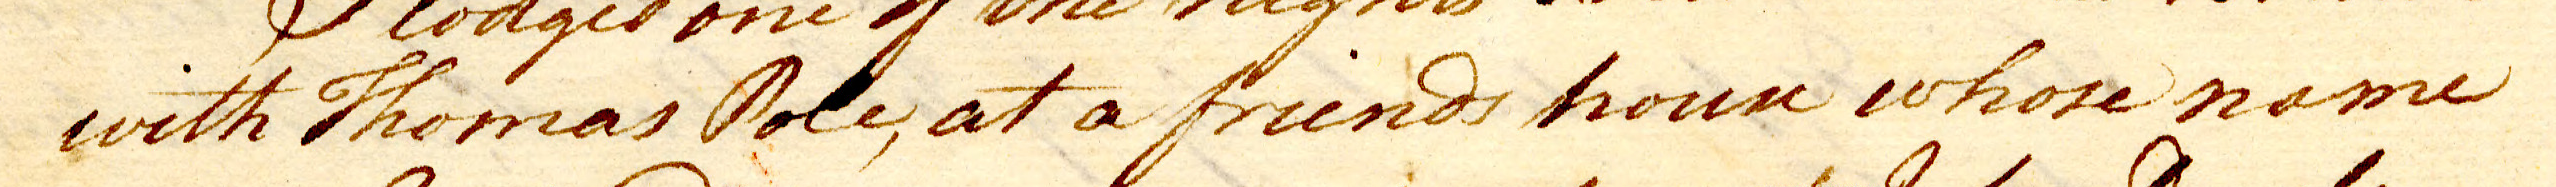with Thomas Pole, at a friends house whose name
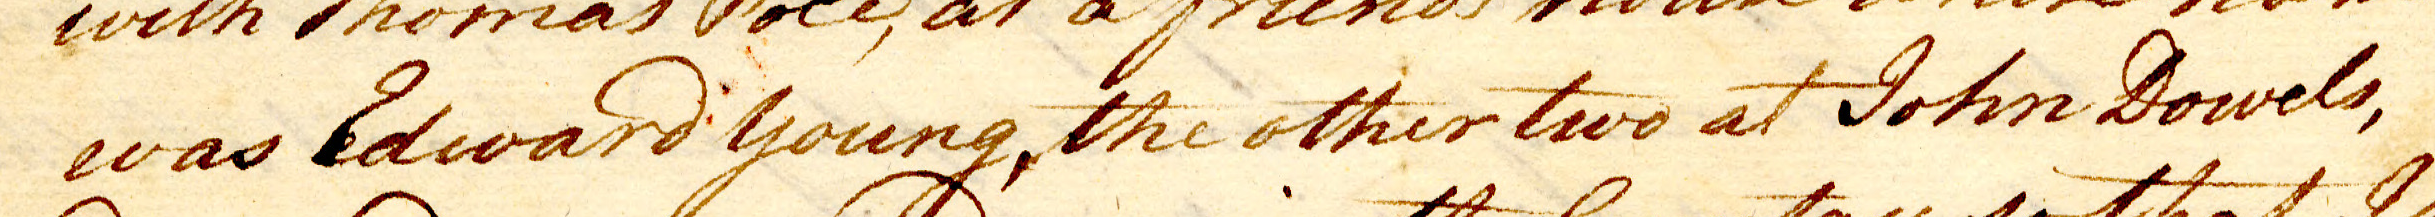was Edward Young, the other two at John Dowels,
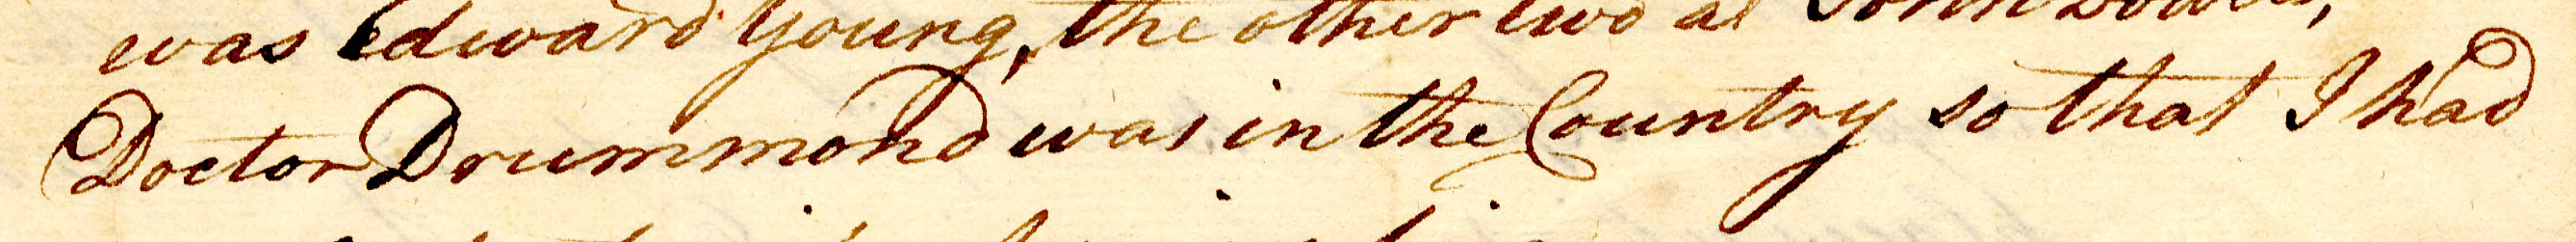Doctor Drummond was in the Country so that I had
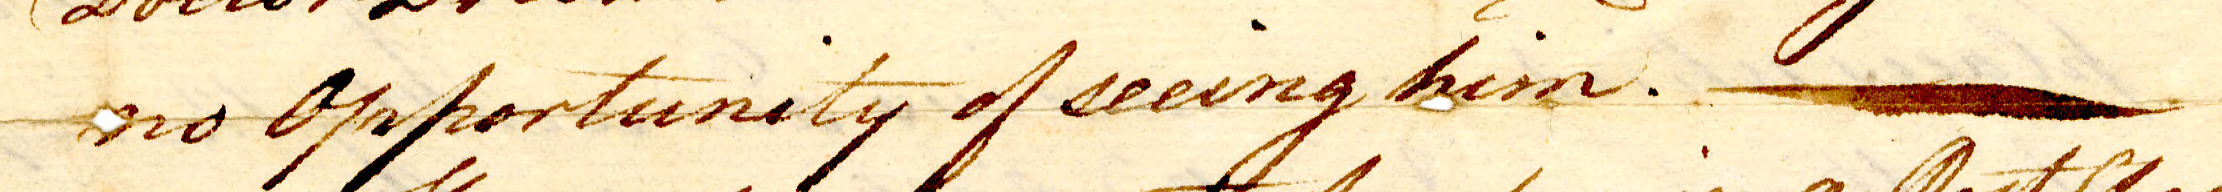no opportunity of seeing him.-
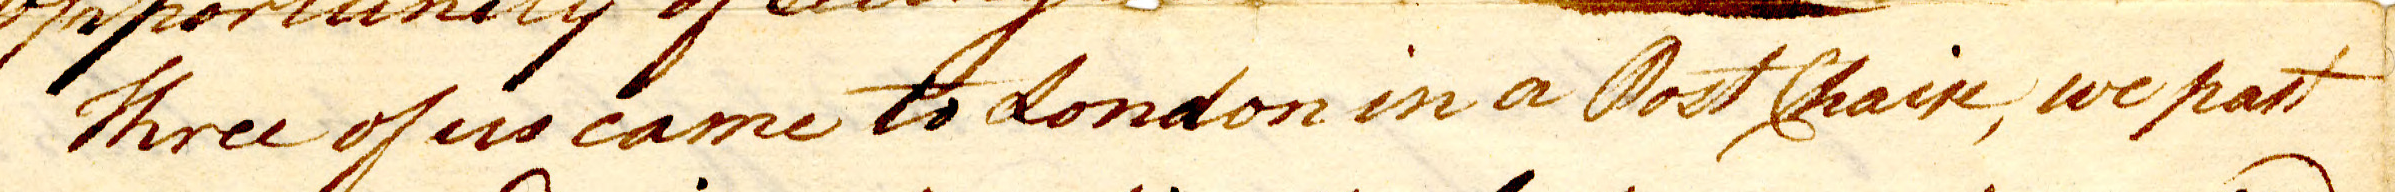Three of us came to London in a Post Chaise, we past
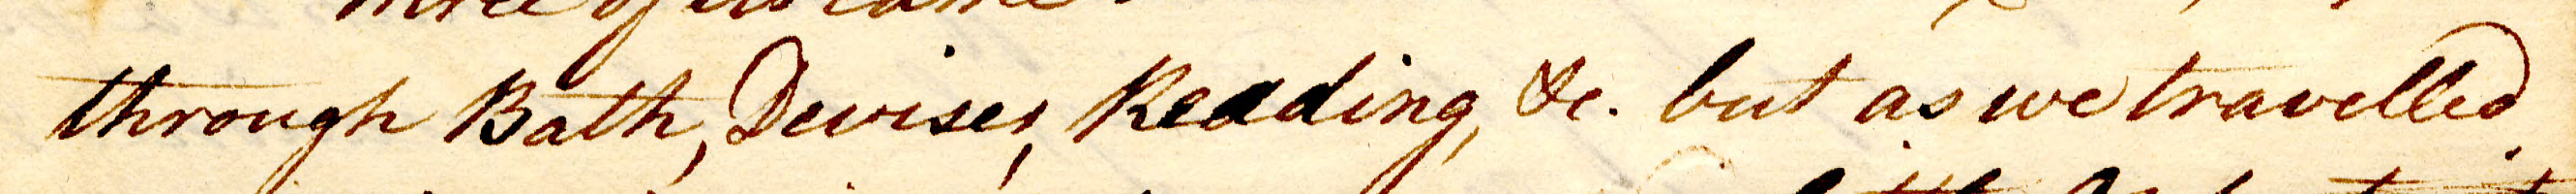through Bath, Devises, Reading, &c. but as we travelled
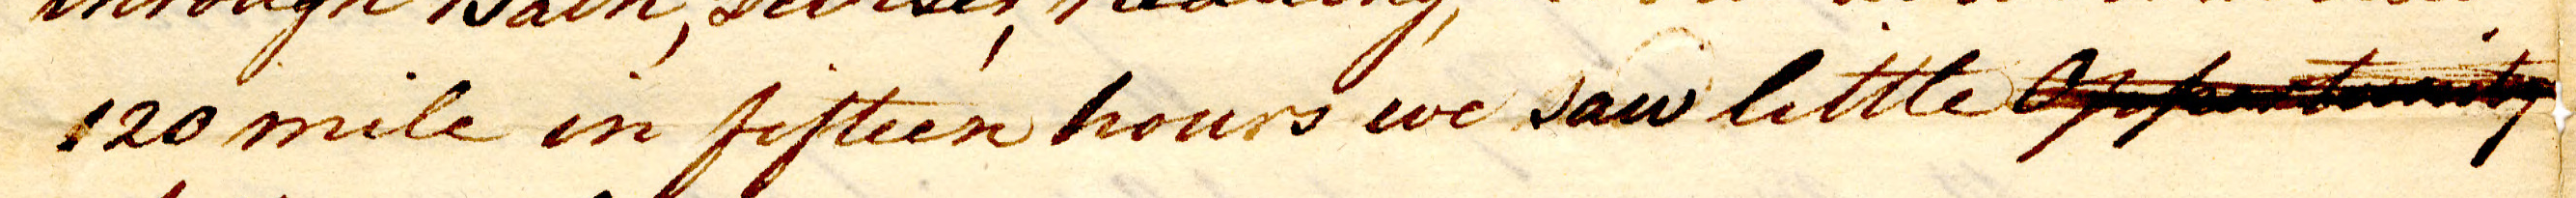120 mile in fifteen hours we saw little [Opportunity]
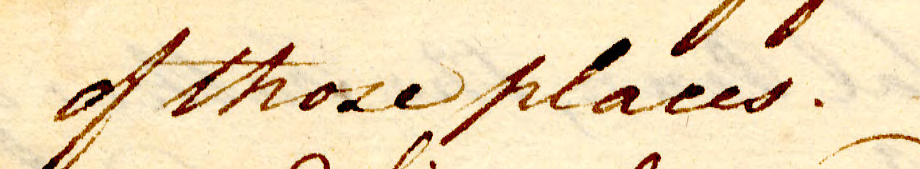of those places.
